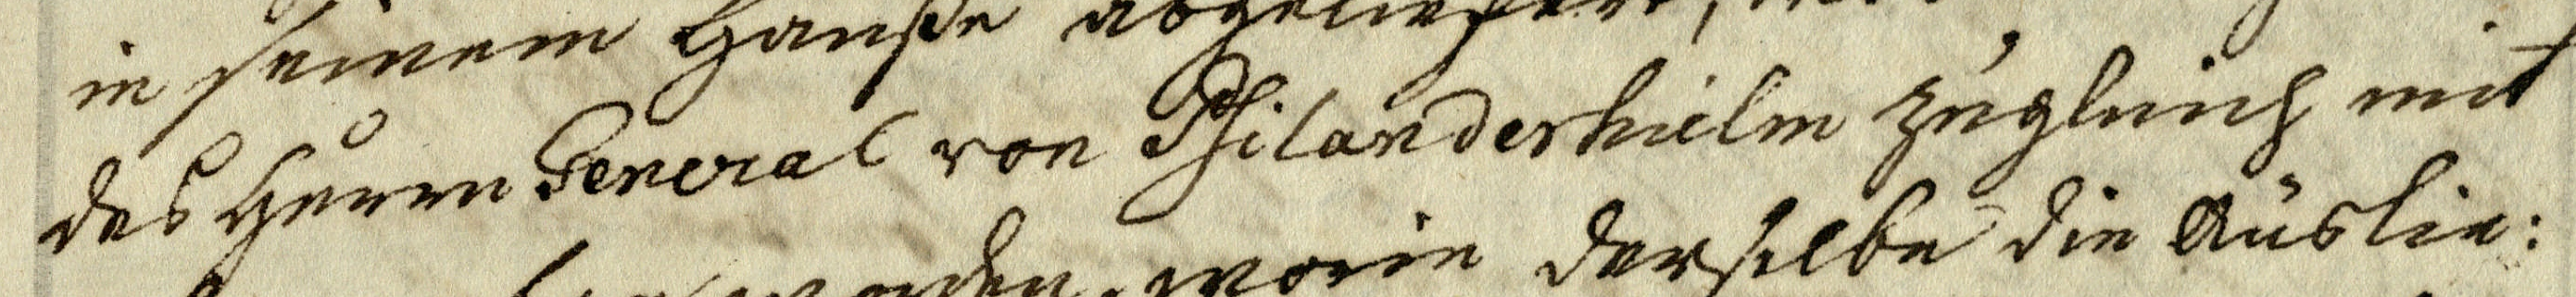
des Herrn General von Philanderhielm zugleich mit
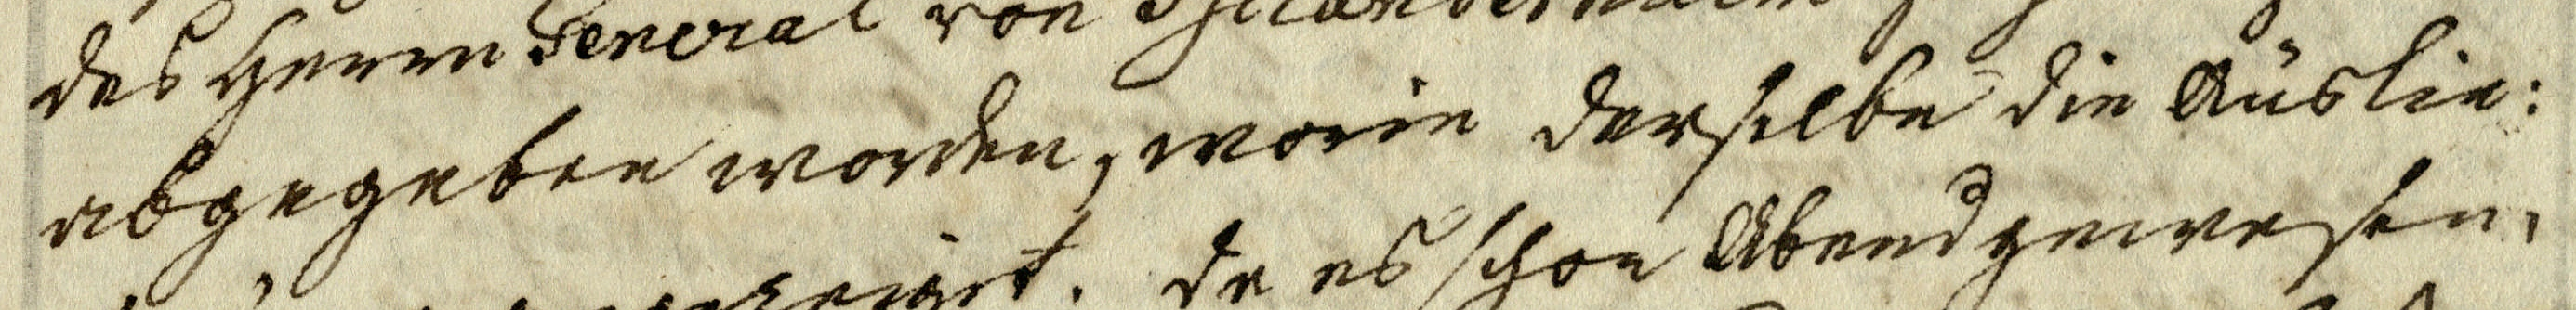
abgegeben worden, worin derselbe die Auslie¬
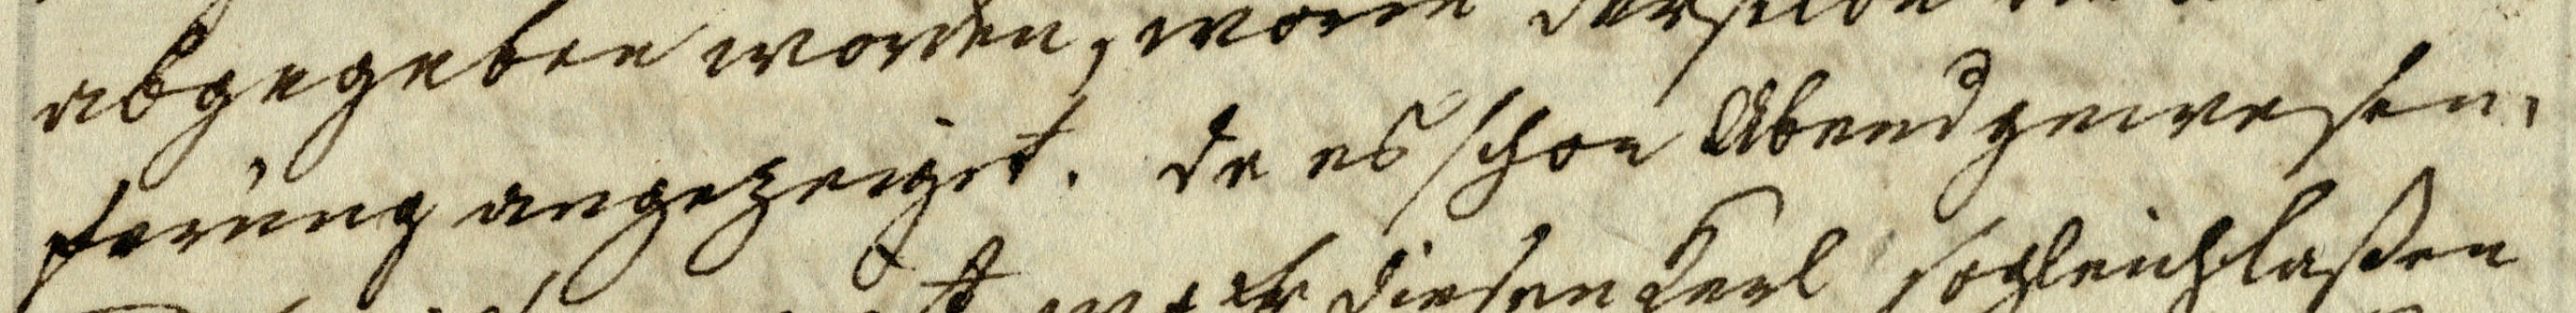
ferung angezeiget. Da es schon Abend gewesen,
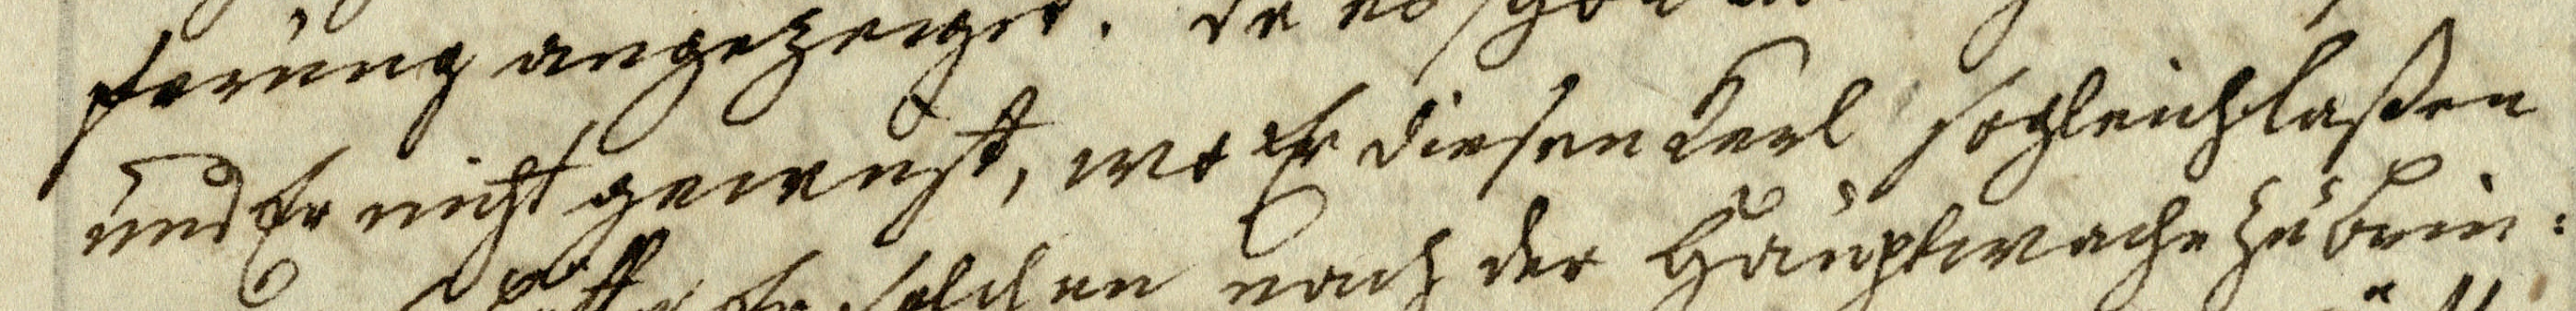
und Er nicht gewust, wo Er diesen Kerl sogleich laßen
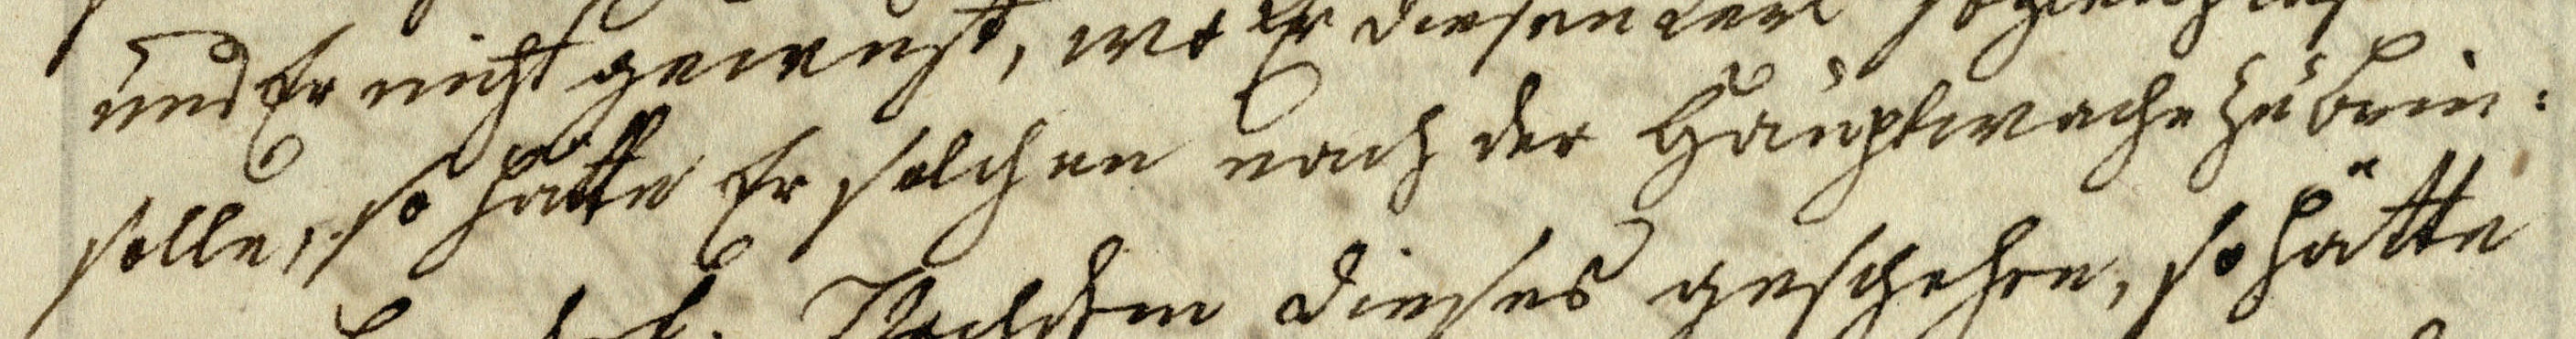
solle, so hätte Er solchen nach der Hauptwache zu brin¬
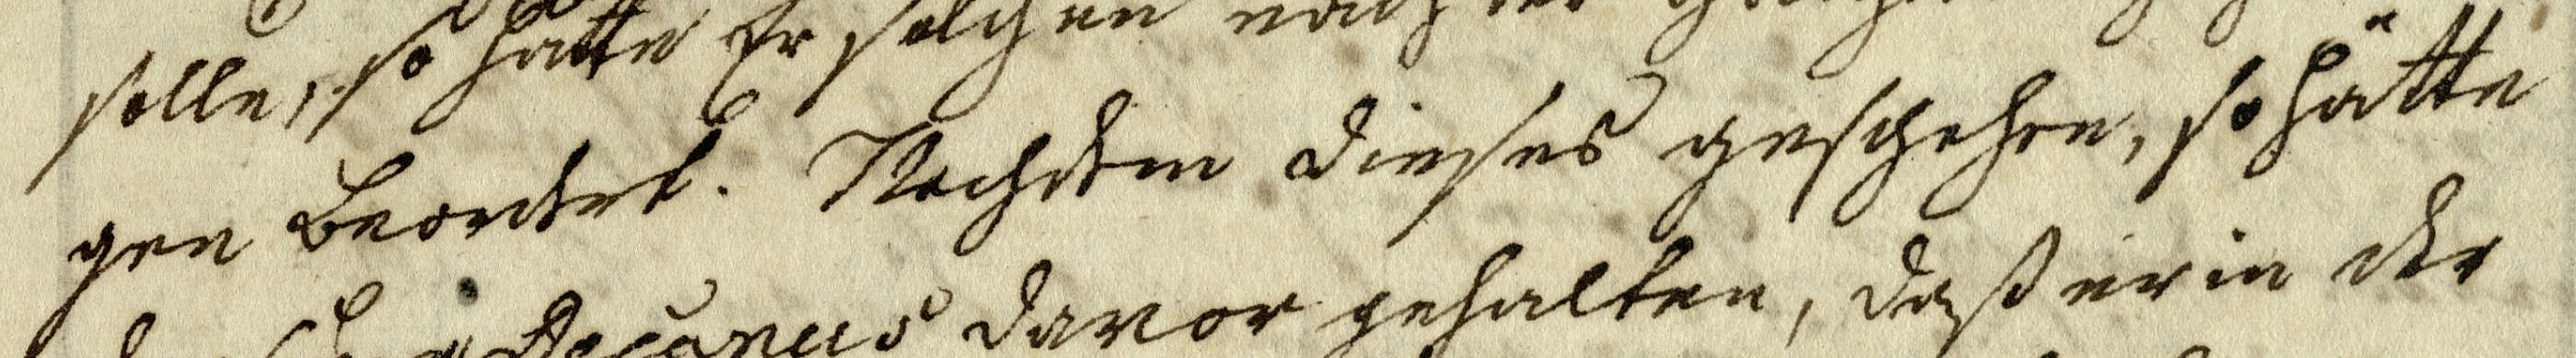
gen beordert. Nachdem dieses geschehen, so hätte
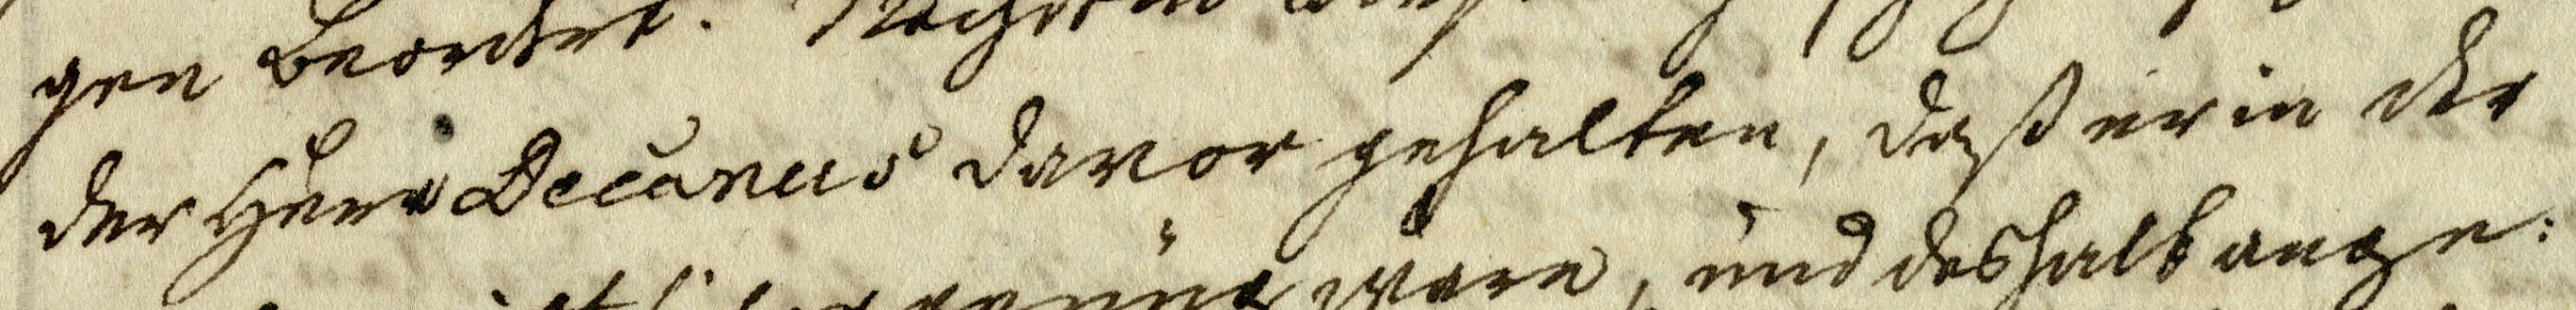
der Herr Decanus davor gehalten, daß er in der
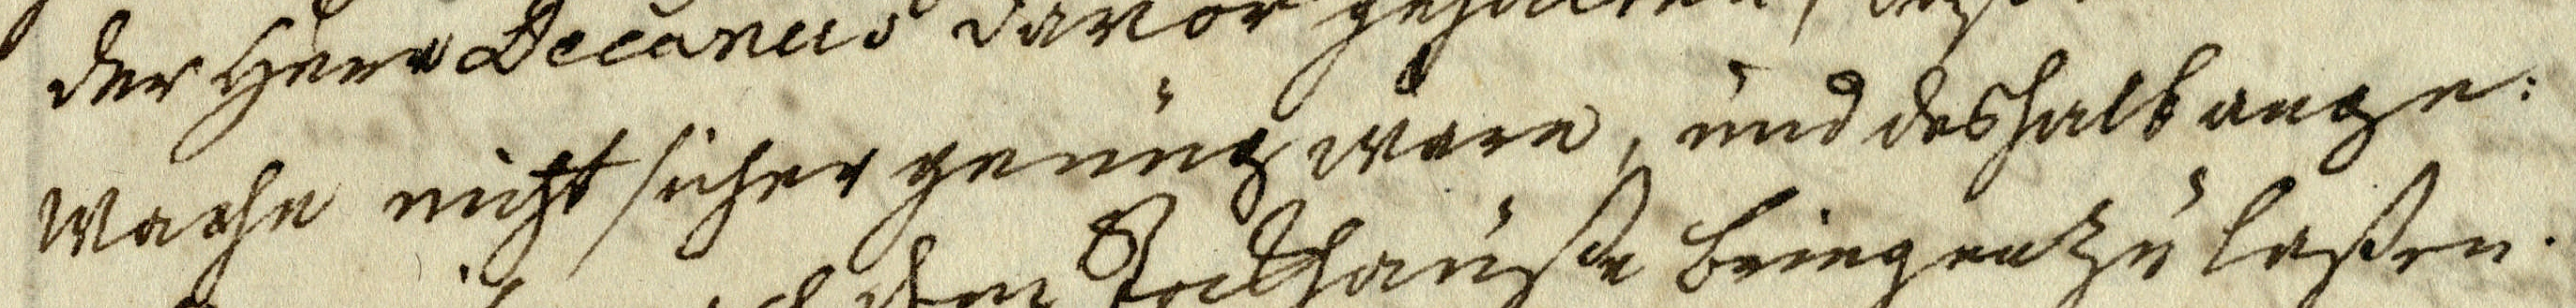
Wache nicht sicher genug wäre, und deshalb ange¬
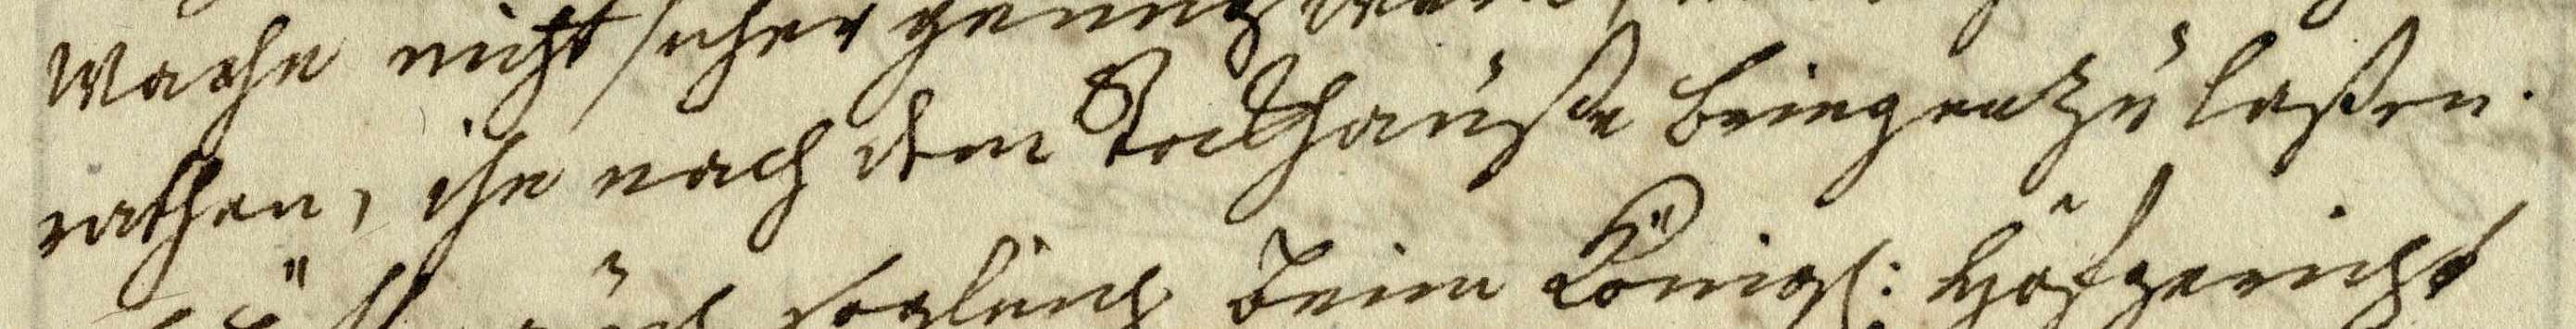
rathen, ihn nach dem Stockhauße bringen zu laßen.
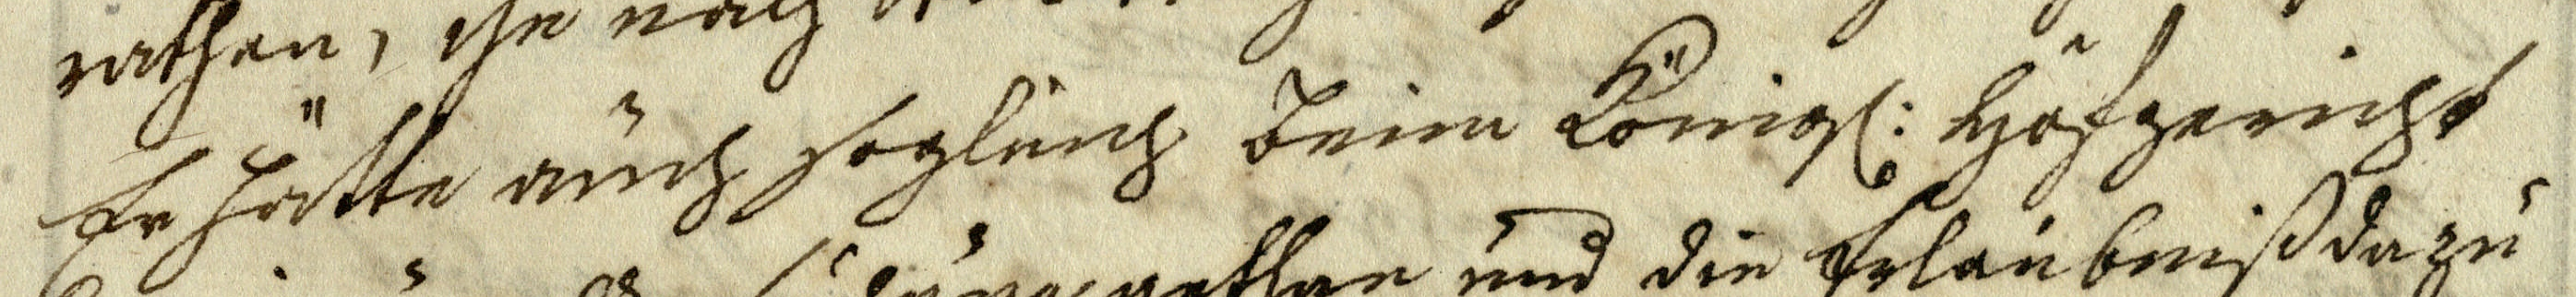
Er hätte auch sogleich beim Königl. Hofgericht
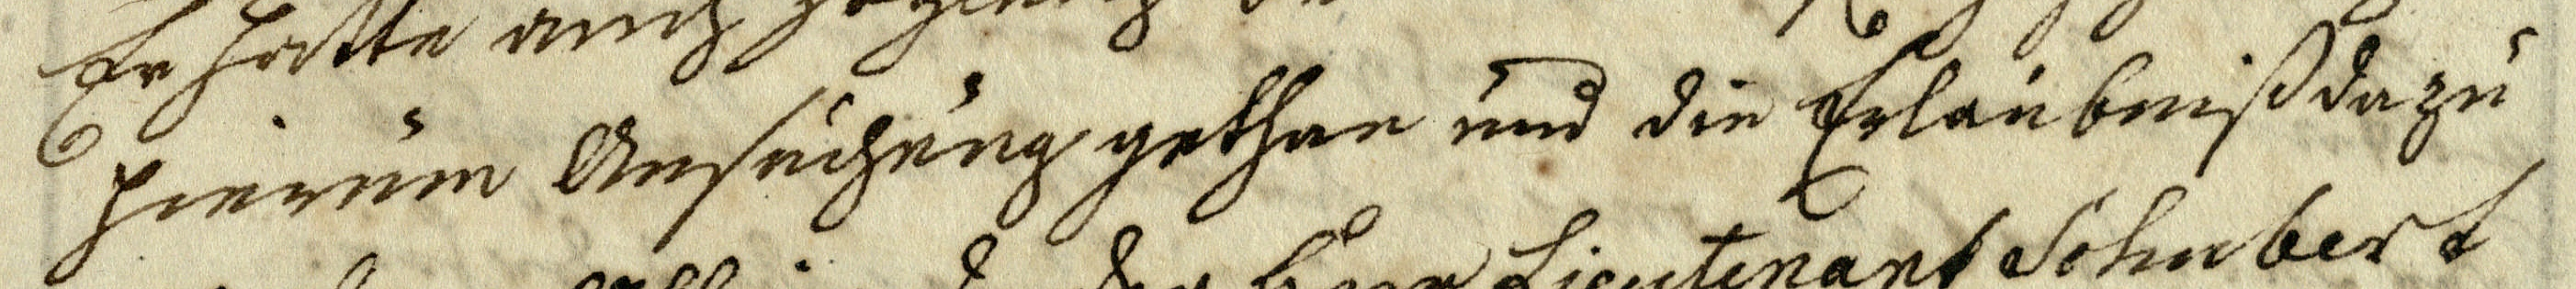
hierum Ansuchung gethan und die Erlaubniß dazu
